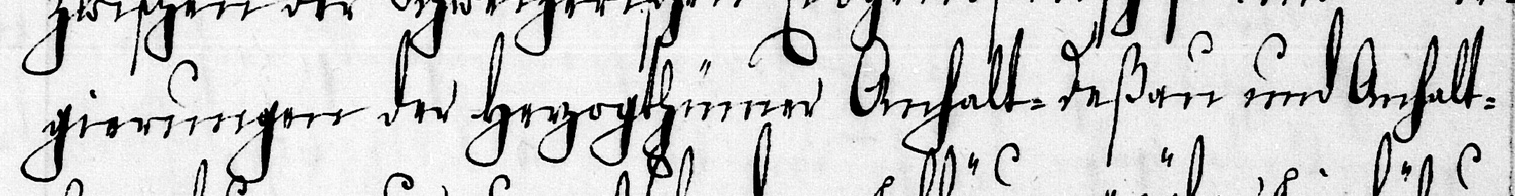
gierungen der Herzogthümer Anhalt-Deßau und Anhal¬
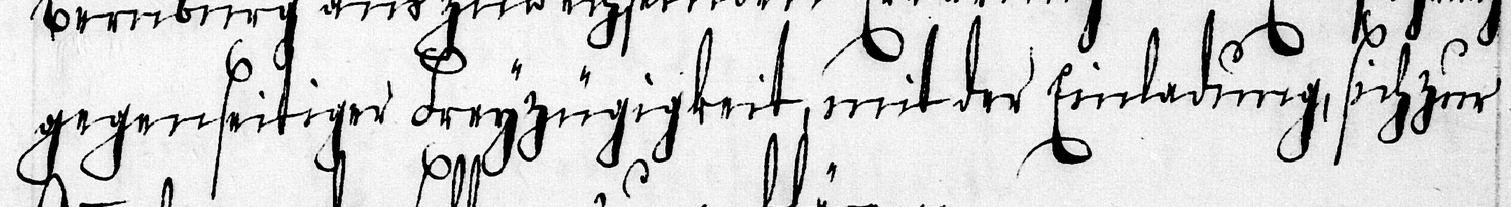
gegenseitiger Freyzügigkeit, mit der Einladung, sich zur
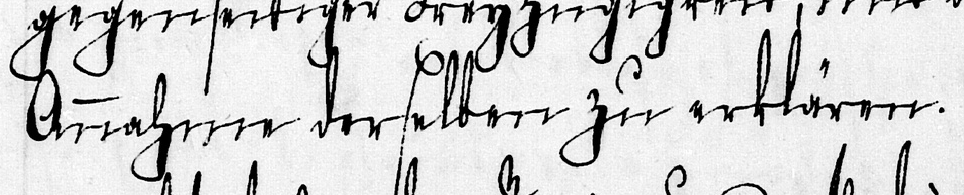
Annahme derselben zu erklären.
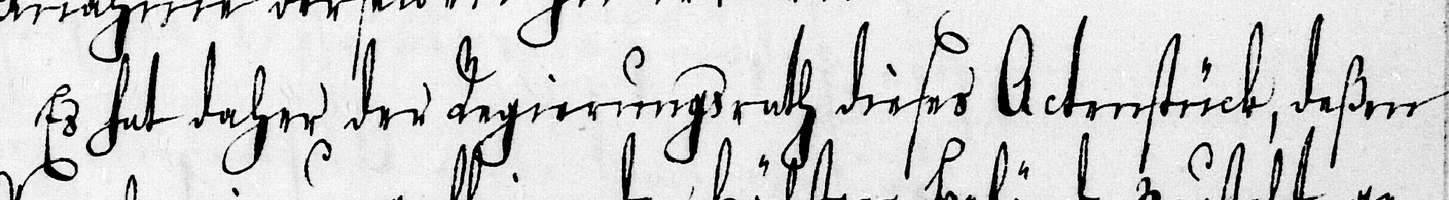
Es hat daher der Regierungsrath dieses Actenstück, deßen
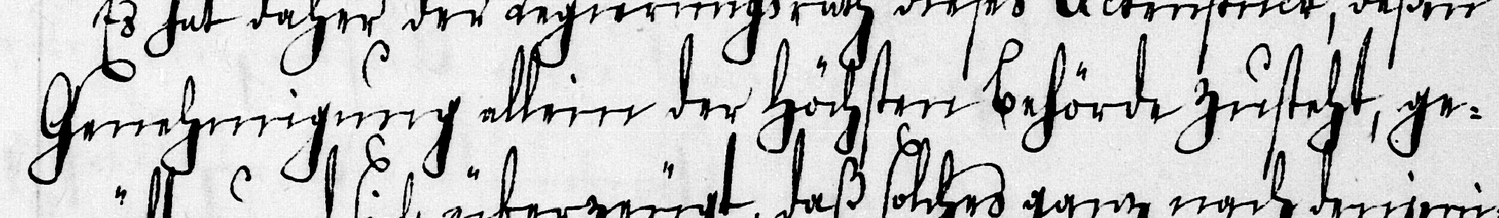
Genehmigung allein der Höchsten Behörde zusteht, ge¬
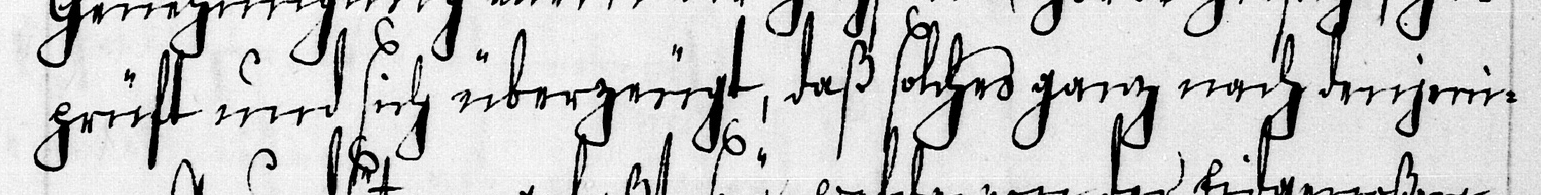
prüft und sich überzeugt, daß solches ganz nach denjeni¬
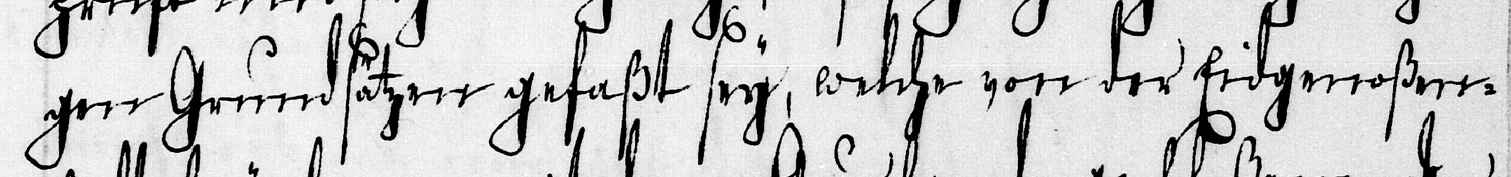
gen Grundsätzen gefaßt sey, welche von der Eidgenoßens¬
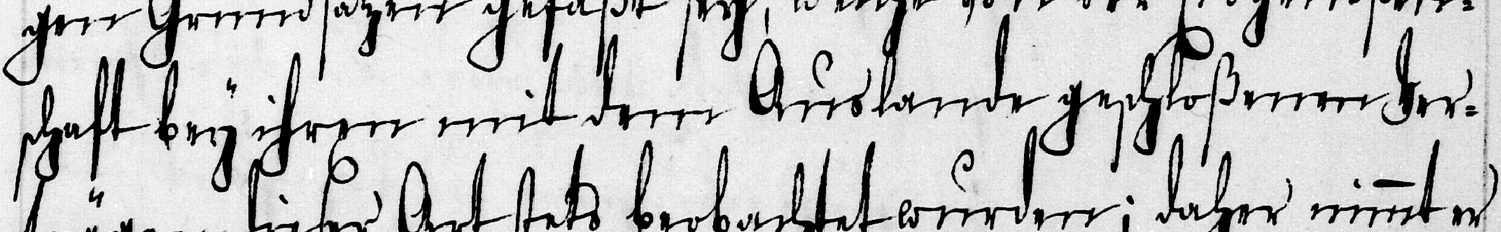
chaft bey ihren mit dem Auslande geschloßenen Ver¬
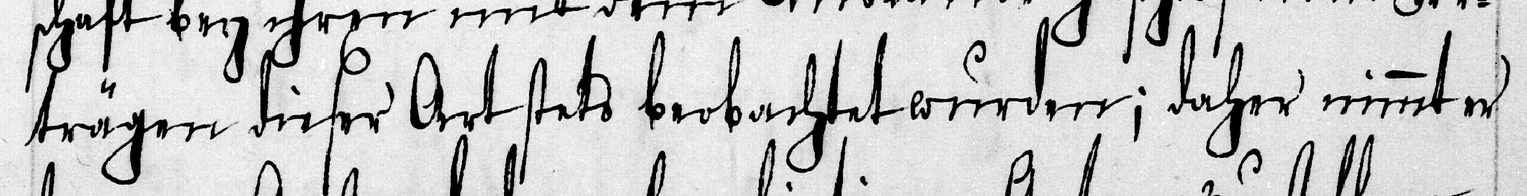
trägen dieser Art stets beobachtet wurden; daher nimmt er
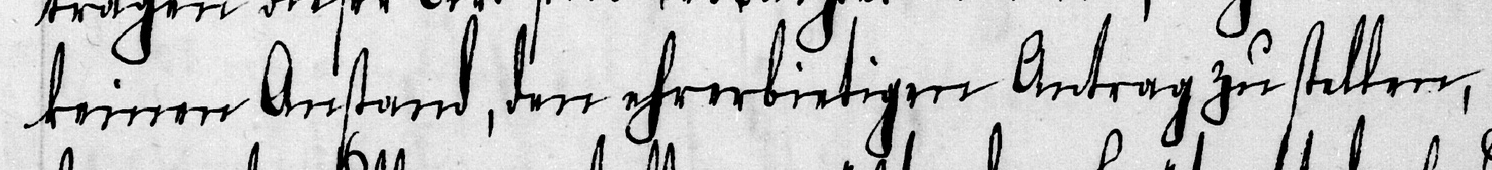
keinen Anstand, den ehrerbietigen Antrag zu stellen,
